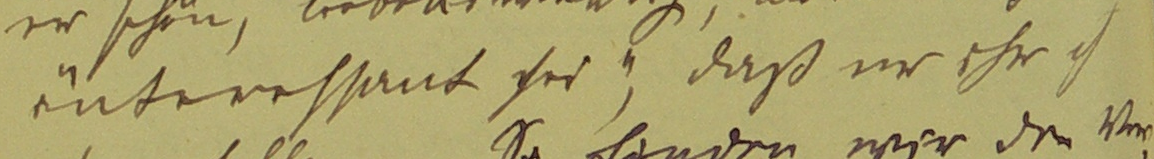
interessant sei, daß er ihr
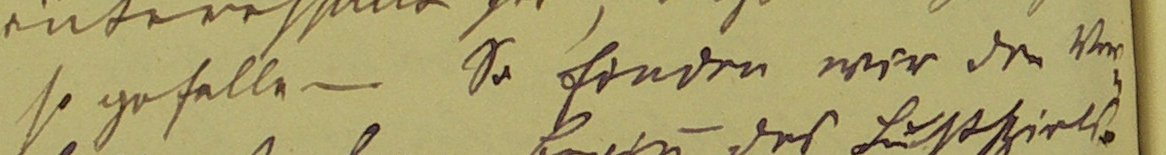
so gefalle,-- So finden wir die Ver¬
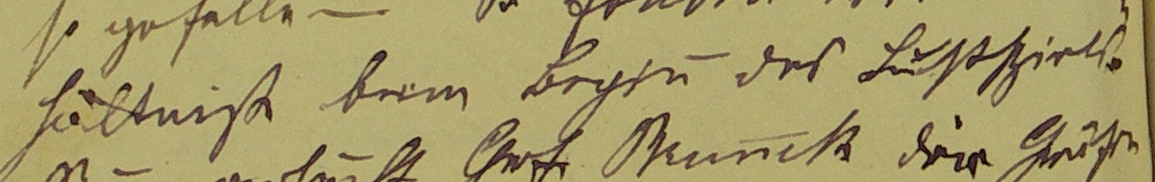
hältnisse beim Beginn des Lustspiels.
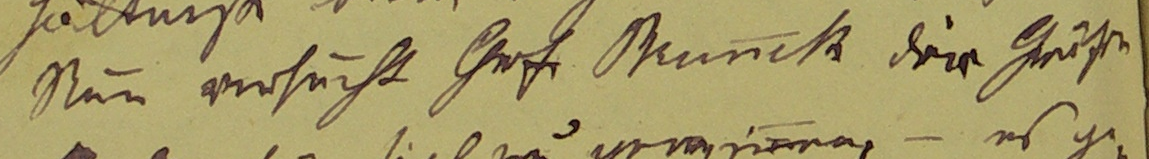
Nun versucht Graf Bruneck die Gräfin
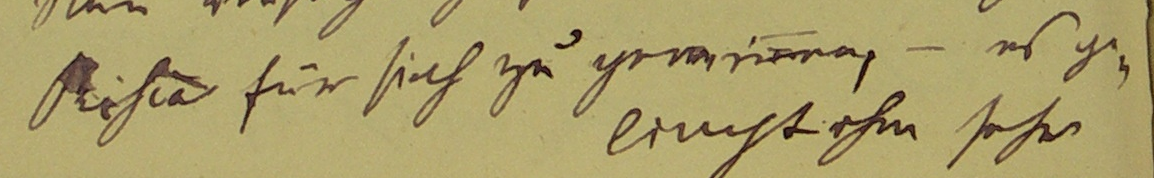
Riha für sich zu gewinnen.-es ge¬
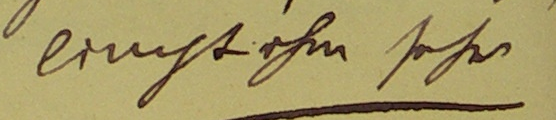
lingt ihm sehr
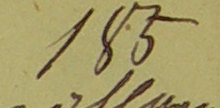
185
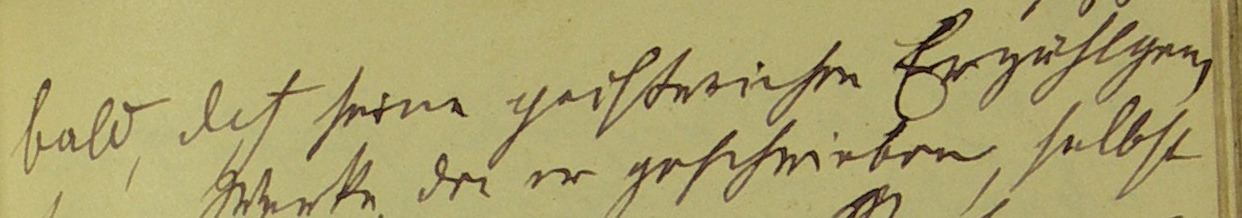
bald, durch seine geistreiche Erzählungen,
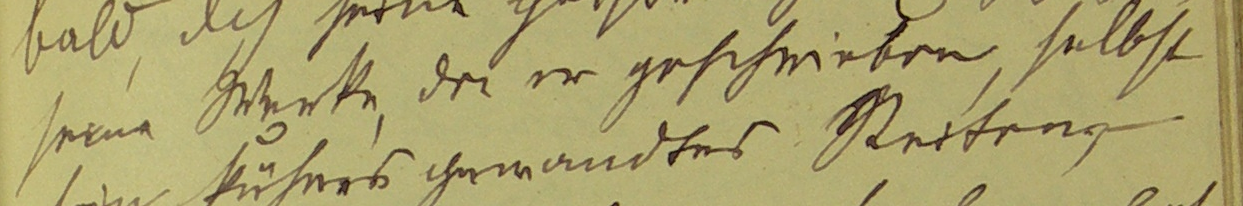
seine Werke, die er geschrieben , selbst
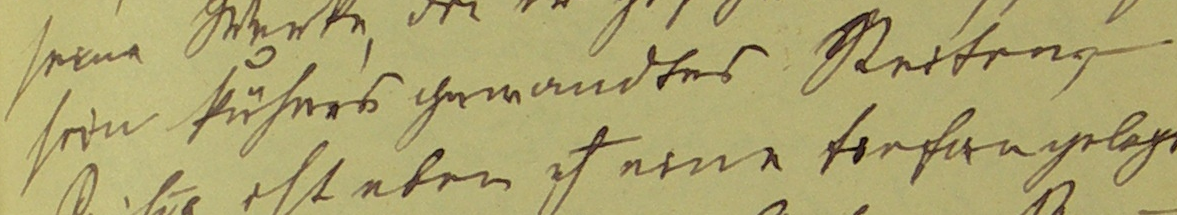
sein kühnes gewandtes Reiten.-
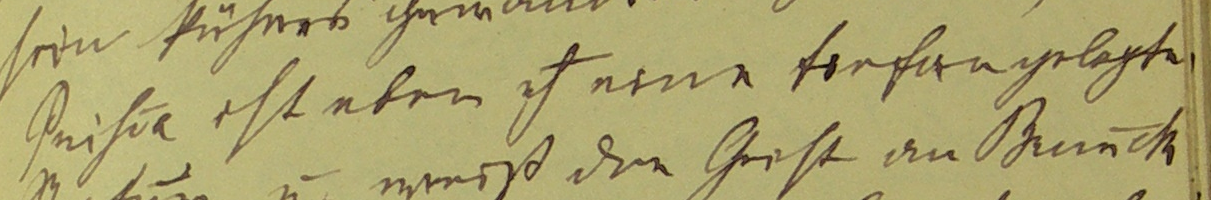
Riha ist eben eine tiefengelagerte
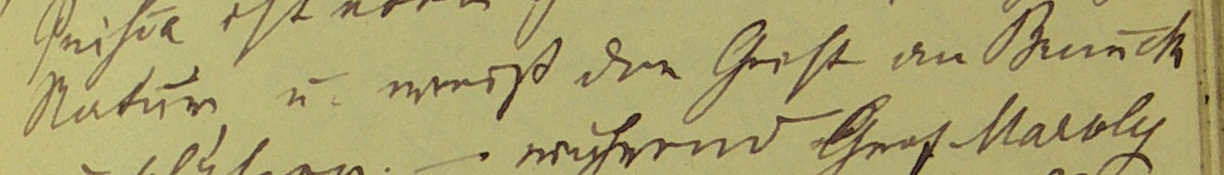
Natur, und weiß den Geist an Bruneck
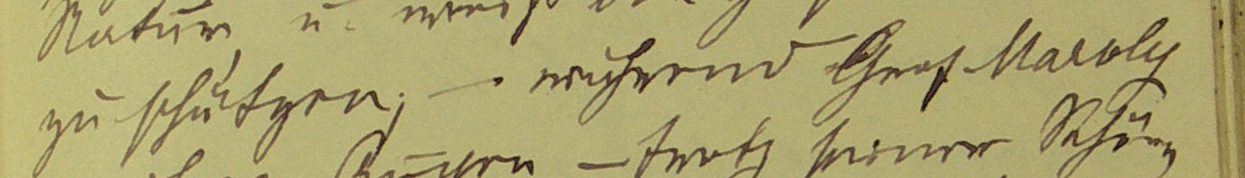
zu schätzen;-- während Graf Maroly
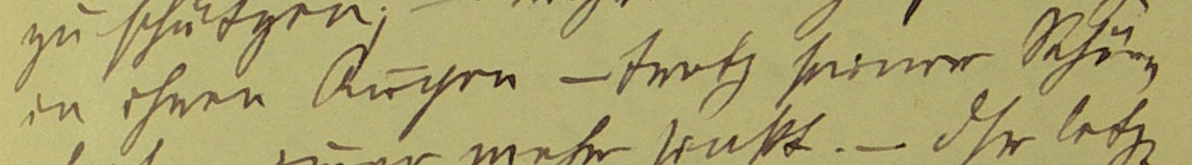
in ihren Augen - trotz seiner Schön¬
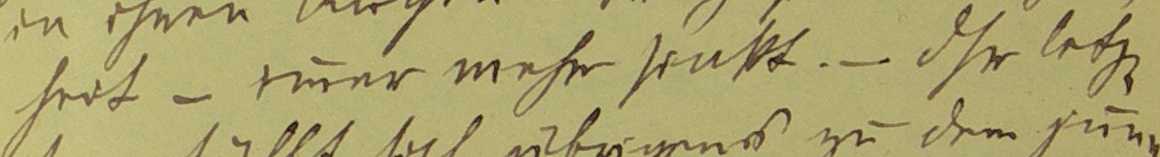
heit- immer mehr sinkt.- Dieser letz¬
